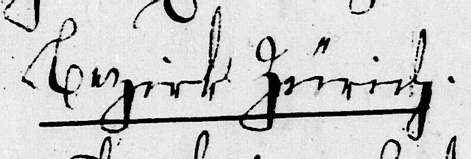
Bezirk Zürich.
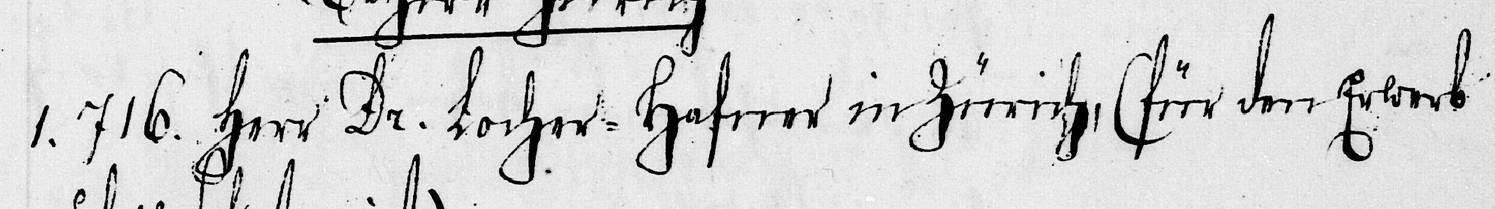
1. 716. Herr Dr. Locher-Hafner in Zürich, (für den Erwerb
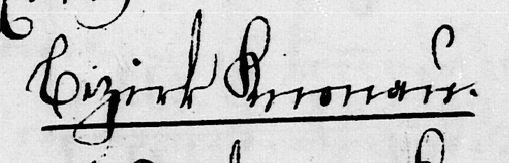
Bezirk Knonau.
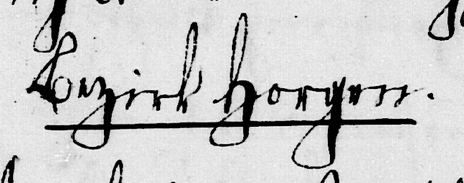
Bezirk Horgen.
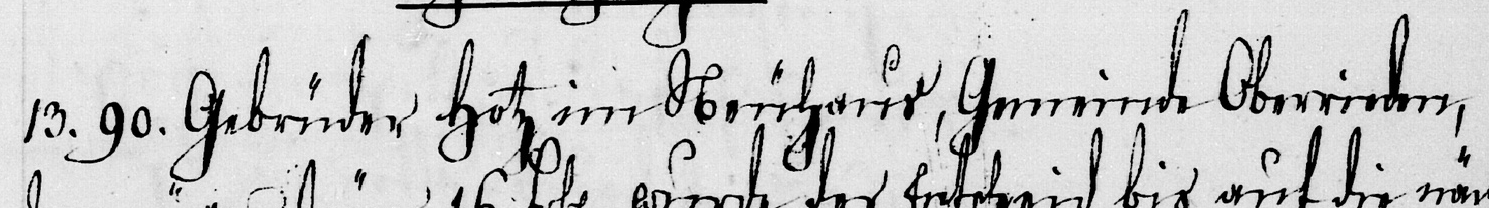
13. 90. Gebrüder Hotz im Neuhaus, Gemeinde Oberrieden,
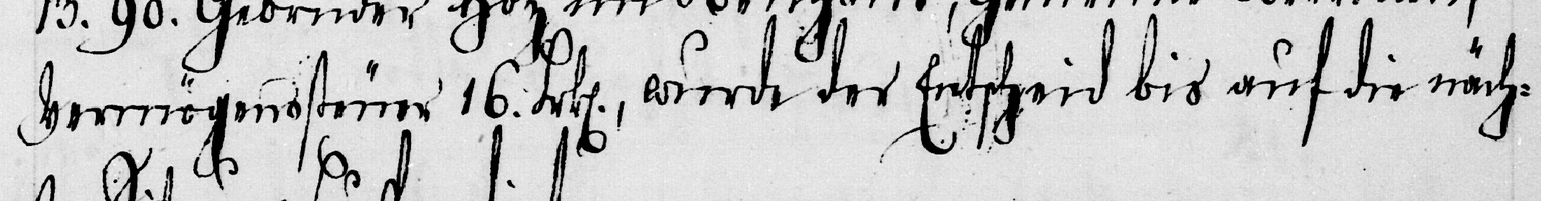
Vermögenssteuer 16. Frk[en], wurde der Entscheid bis auf die näch¬
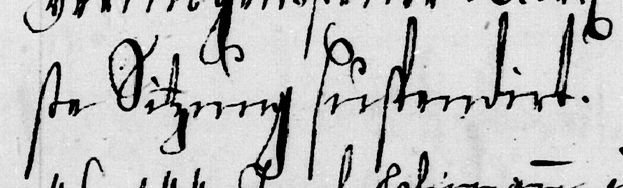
te Sitzung suspendirt.
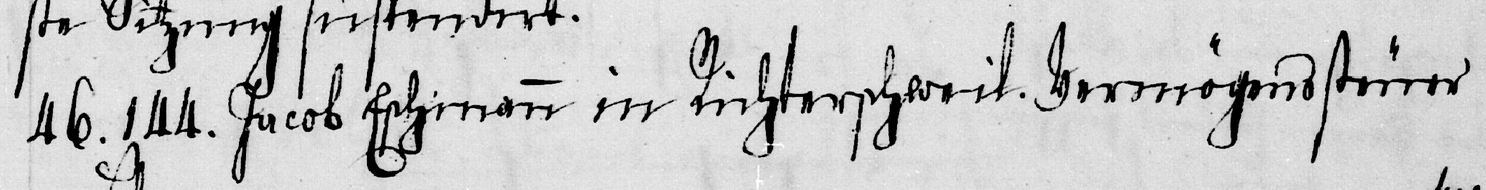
46. 144. Jacob Eschmann in Richterschweil. Vermögenssteuer
